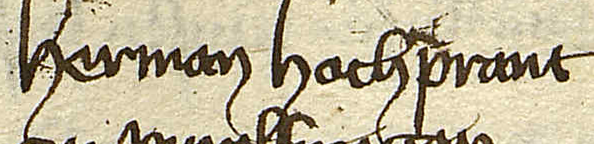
herman hochprant
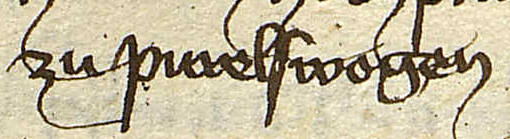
ʒu Purelſwogen
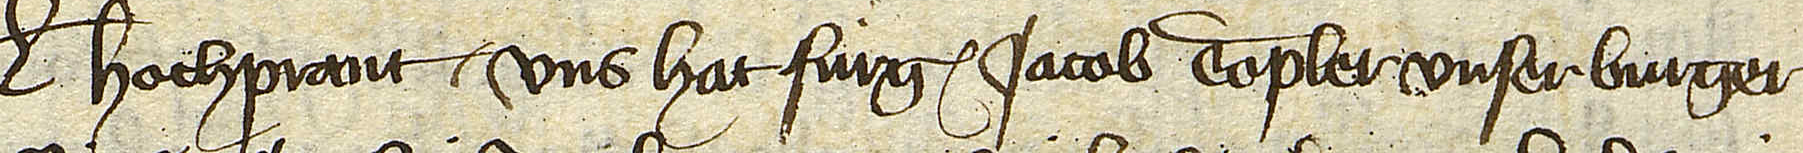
L* hochprant / vns hat fürg* Iacob Topler vnſer burger
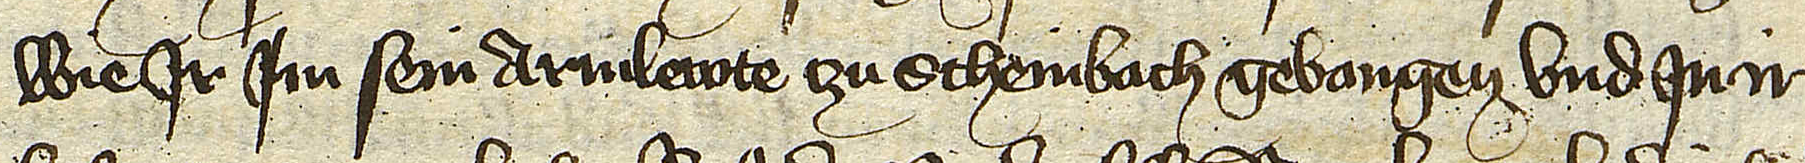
wie Ir Im ſein Armlewte cʒu Scheinbach gevangen vnd In ir
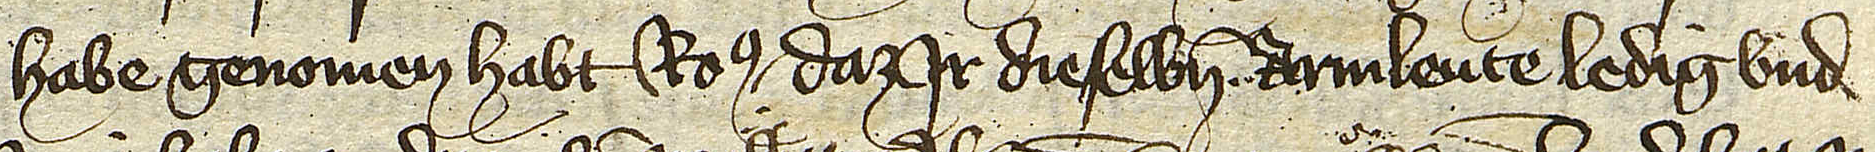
habe genomen habt Ro* / daʒ Ir dieſelben* ~ Armleute ledig vnd
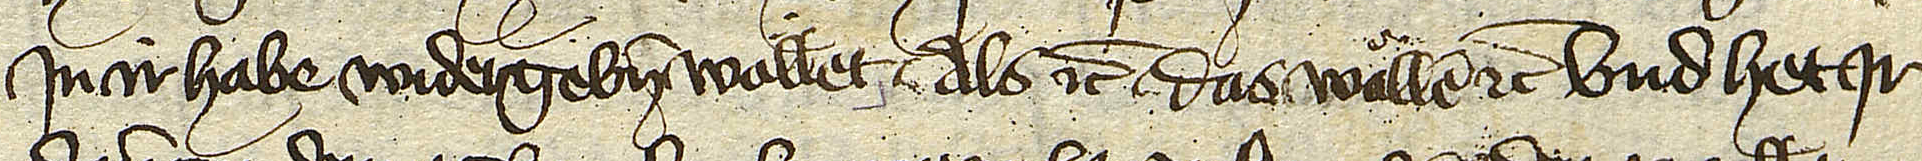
In ir habe widergebn* wöllet / Als ec* / das wölle* ec* vnd het Ir
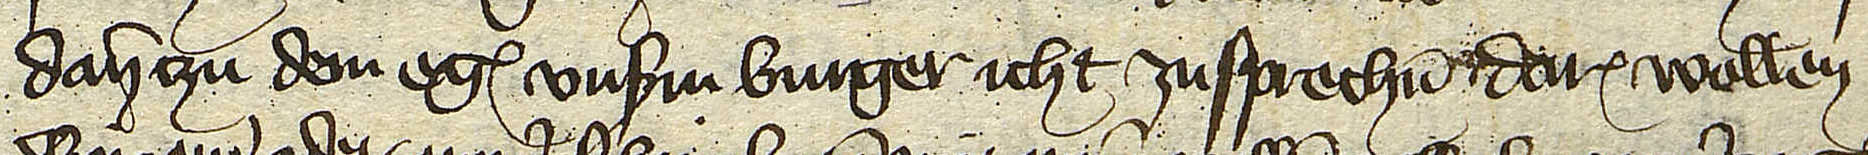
dan* cʒu dem eg* vnſ*m burger icht cʒuſprechn* / dar* wollen
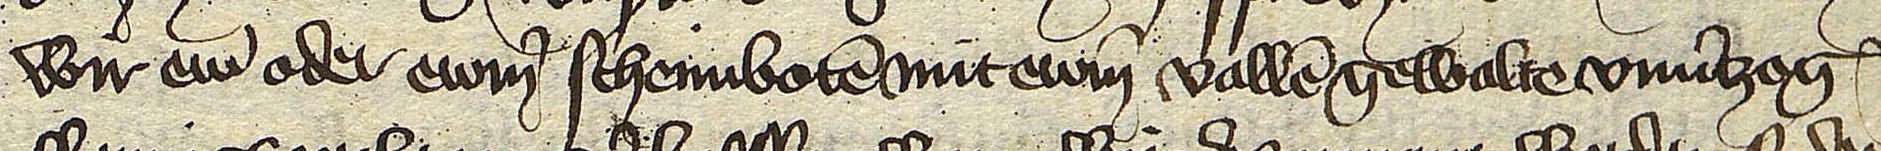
wir ew* oder ewm* ſcheimbote* mit ewm* volle* gewalte vnu*cʒog*
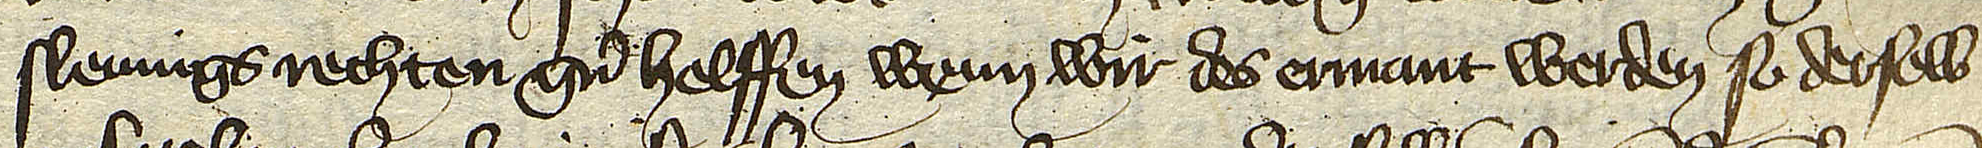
ſleunigs rechten gn* helffen wenn wir des ermant werden ſo derſelb
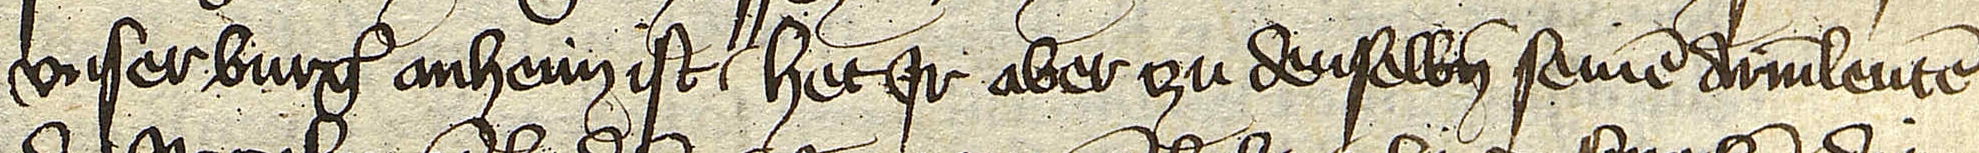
vnſer burg* anheim iſt / het Ir aber cʒu denſelbn* ſeine* Arm*leute*
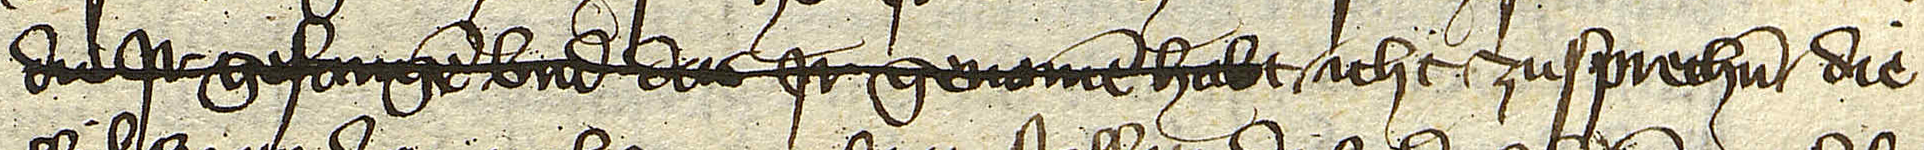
die Ir gefange* vnd das Ir genome* habt / icht cʒuſprechn* / die
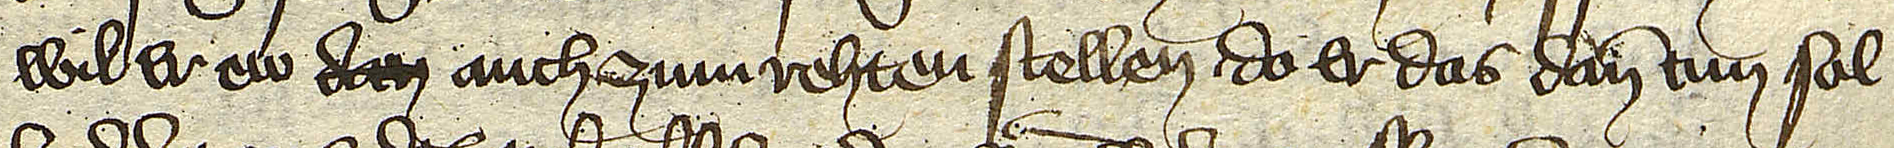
wil Er ew dan auch cʒum rehten ſtellen / do Er das dan* tun ſol
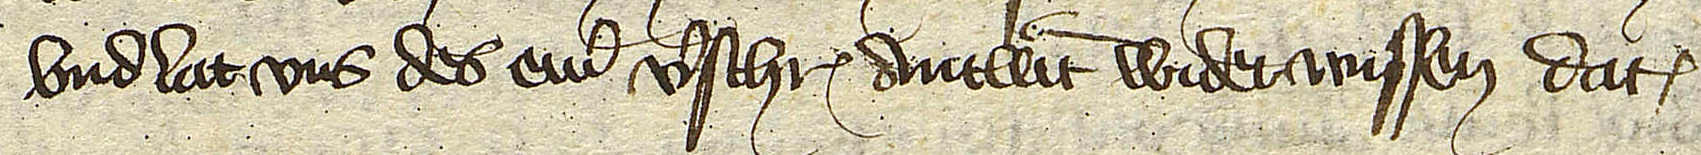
vnd lat vns des ew* v*ſchr* Antw*t wider wiſſen dat*
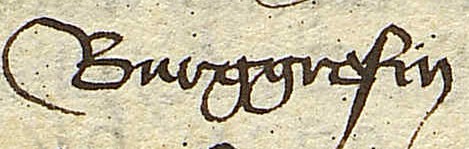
Burggrefin
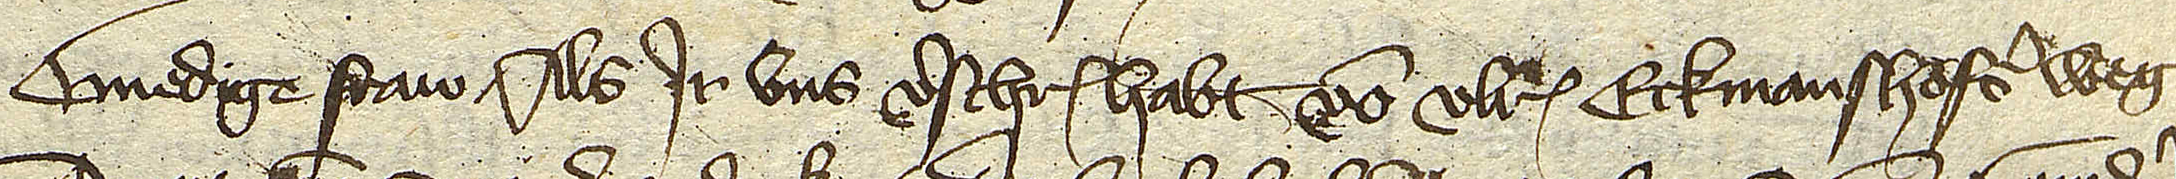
Gnedige fraw / Als Ir vns v*ſchr* habt vo* vlr* Eckmanſhofs* weg*
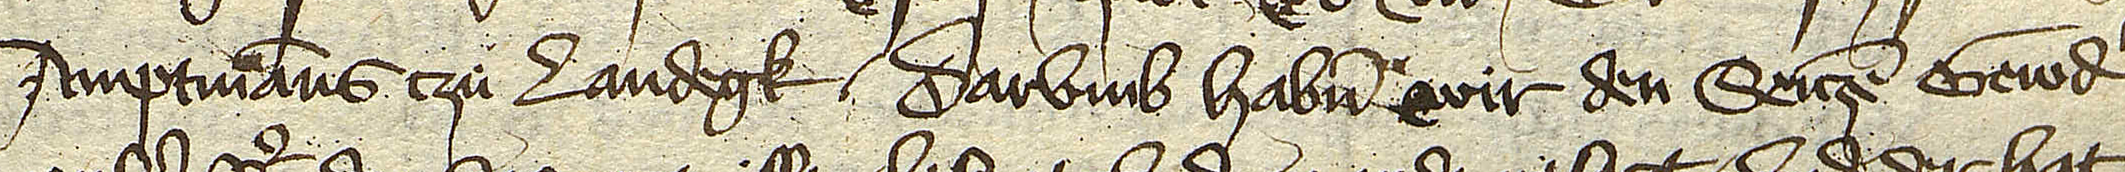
Amptman*s cʒü Landegk / Darvmb habn* wir den Seicʒe* Gewd*
